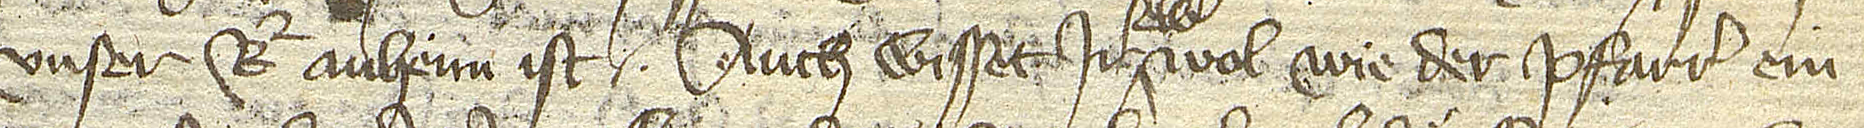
vnſer B* anheim iſt / . Auch wiſſet Ir wol wie der Pfarr* ein
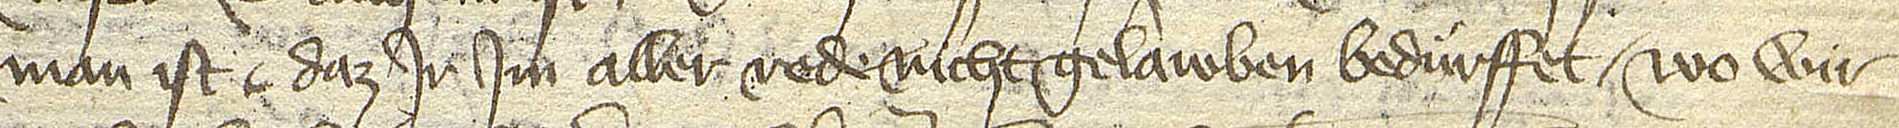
man iſt / daʒ Ir Im aller rede nicht gelawben bedürffet / wo wir
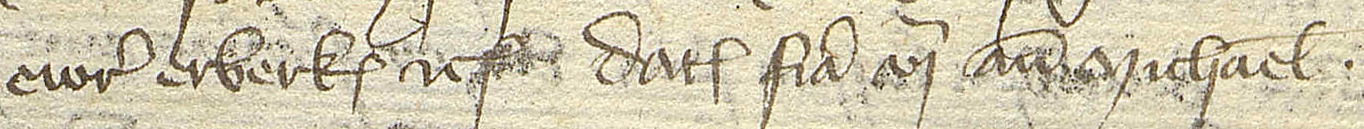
ewr* erberk* ec* Dat* fia* vi* an* Michael* .
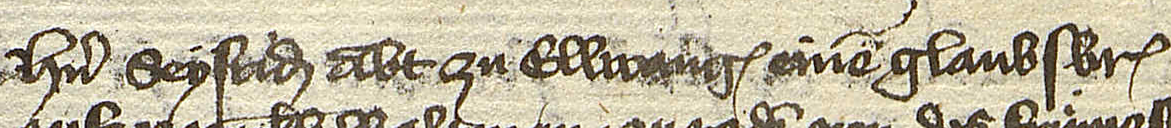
hn* Seyfrid* Abt cʒu Ellwang* eine* glaubſbr*
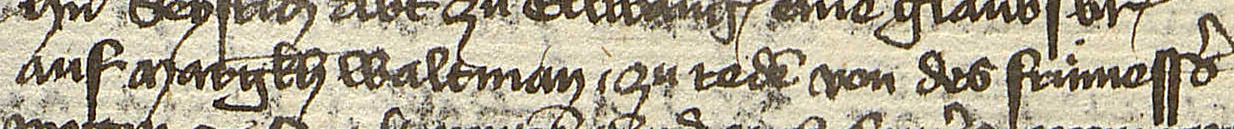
auf Margkh* Waltman / cʒu rede* von des frümeſſs*
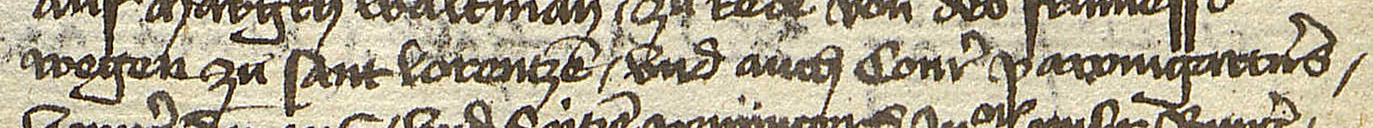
wegen cʒu ſant lorencʒe* / vnd auch Conr* pawmgartns* /
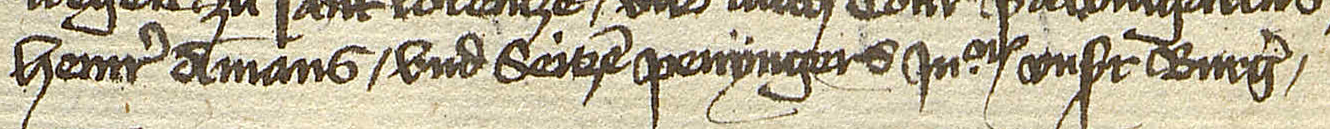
heinr* Aman*s / vnd Seicʒe* Penyngers Iu* . vnſ*r Burg* /
